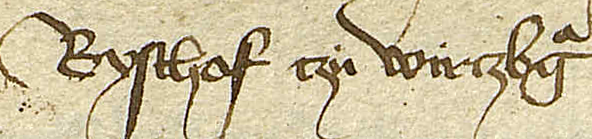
Byſchof cʒü Wircʒb*g
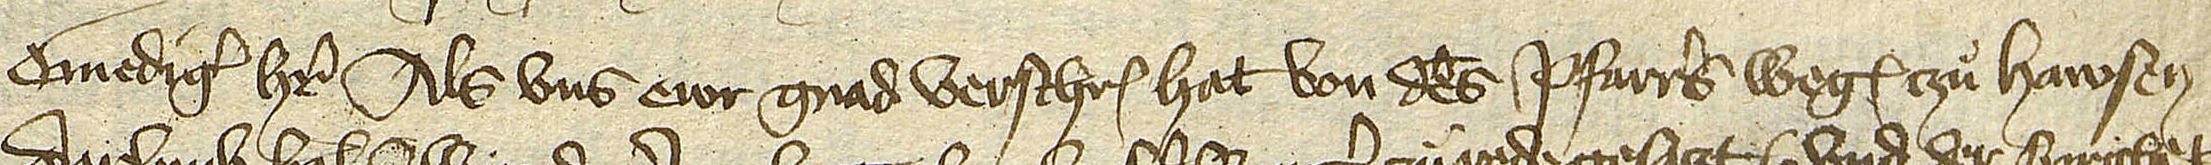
Gnedig* hr* Als vns ewr gnad verſchr* hat von des Pfarr*s weg* cʒü hawſen
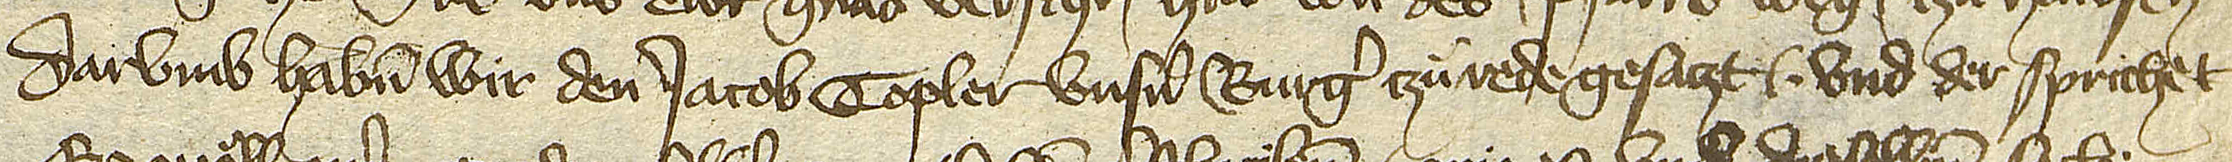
darvmb habn* wir den Iacob Topler vnſn* Burg* cʒü rede geſacʒt / . vnd der ſprichet
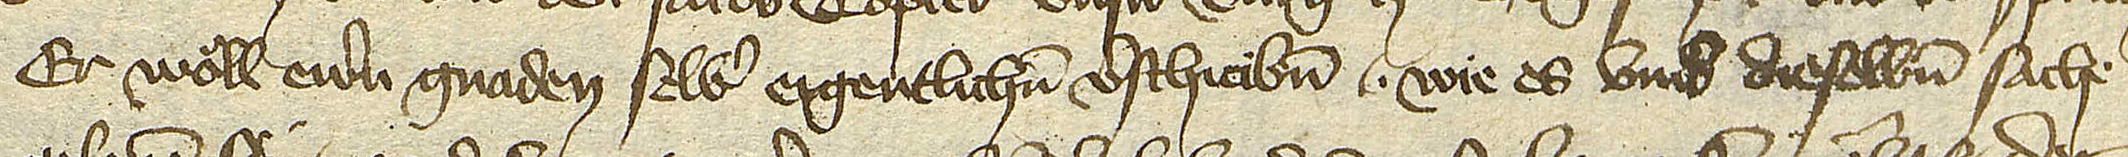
Er wöll ew*n gnaden ſelb* eigentlichn* v*ſchreibn* / . wie es vmb dieſelbn* ſache
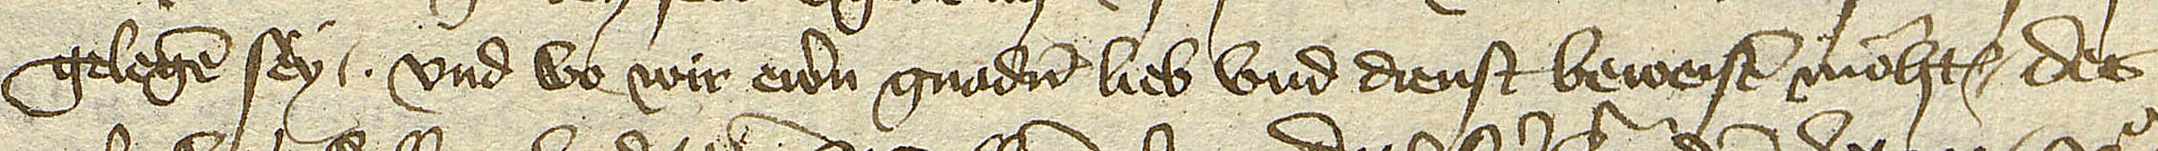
gelege* ſey / . vnd wo wir ew*n gnadn* lieb vnd dienſt beweiſe* möht* / des
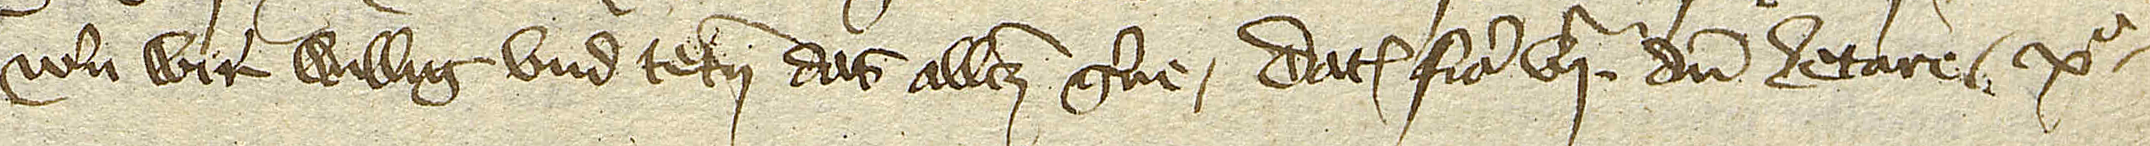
w*n wir willlig vnd tetn* das allcʒ* g*ne / Dat* fia* vi*. An* Letare / x* /
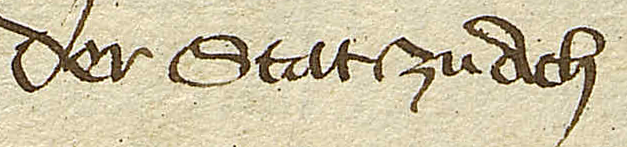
Der Stat cʒu Ach
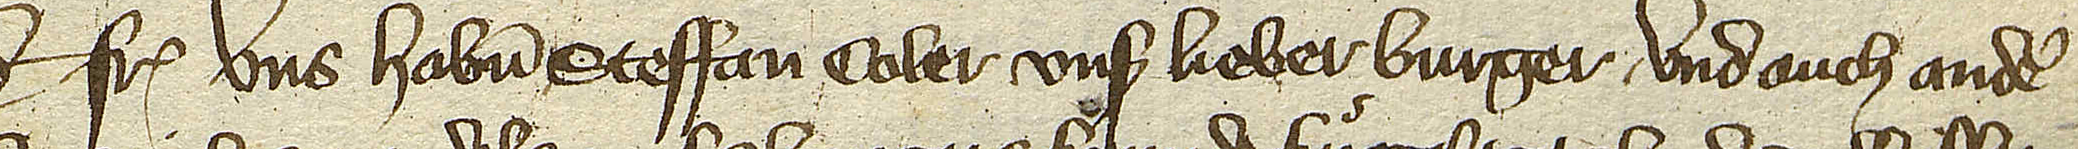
L* fr* vns habn* Steffan Coler vnſ* lieber burger / vnd auch and*
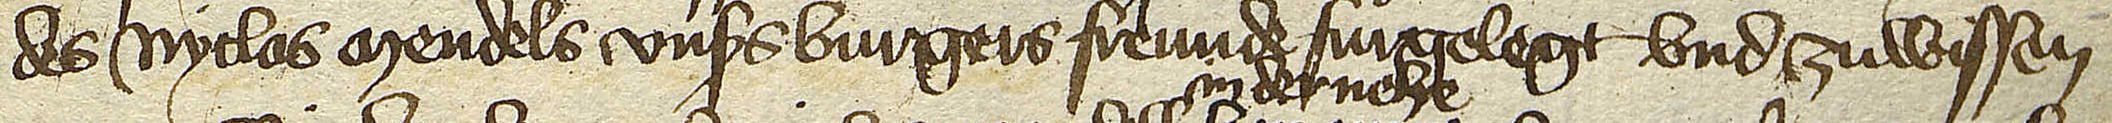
des Nyclas Mendels vnſ*s burgers freunde fürgelegt vnd cʒuwiſſen
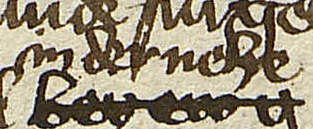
in der nehe
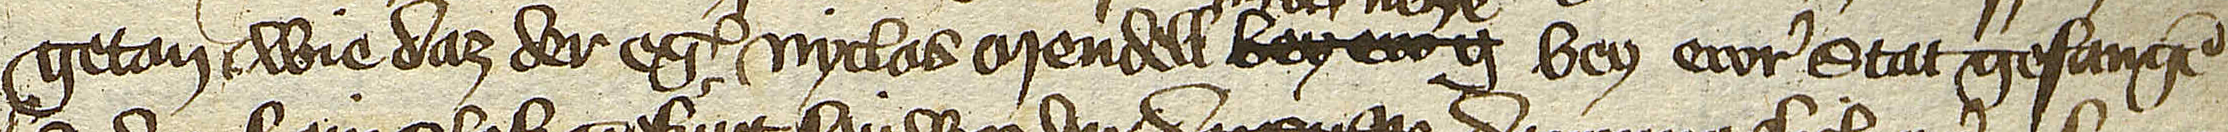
getan / wie daʒ der eg* Nyclas Mendell bey ew g bey ewr* Stat gefange*
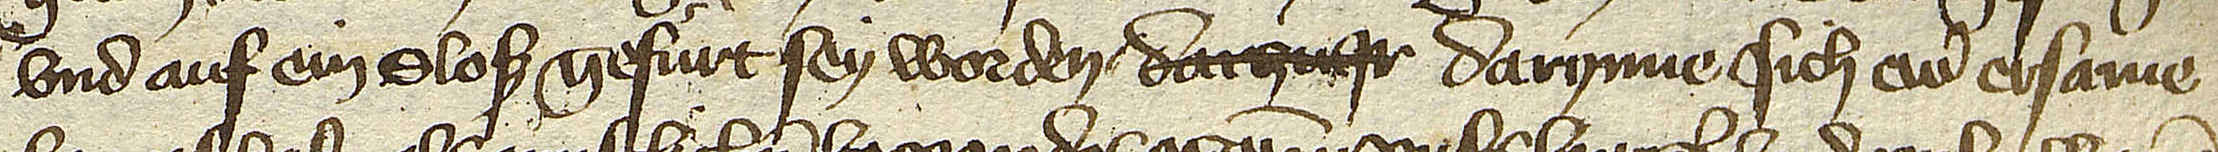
vnd auf ein Sloſ* gefürt ſey worden / darcʒu Ir darynne ſich ew* erſame
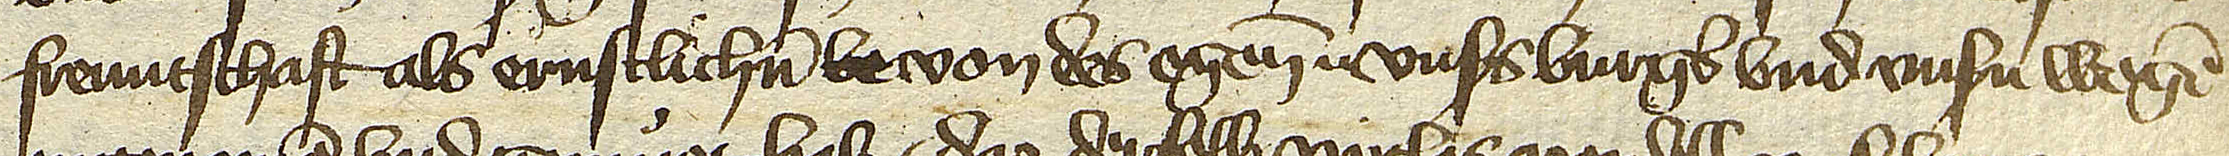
freuntſchaft als ernſtlichn* be von des egen* ~ vnſ*s burgs* vnd vnſ*n wege*
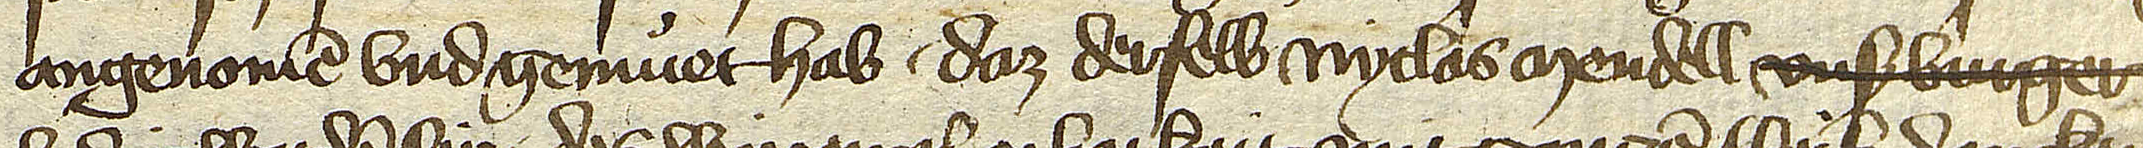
angenome* vnd gemüet hab / daʒ derſelb Nyclas Mendell vnſ* burger
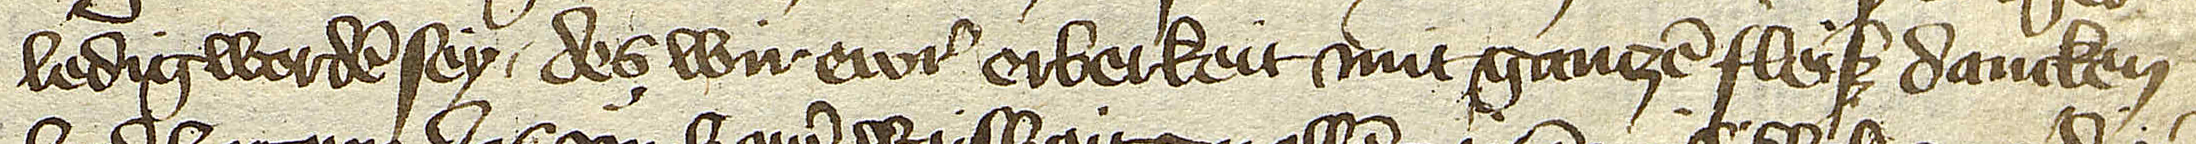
ledig worde* ſey / des wir ewr* erberkeit mit gancʒe* fleiſ* dancken
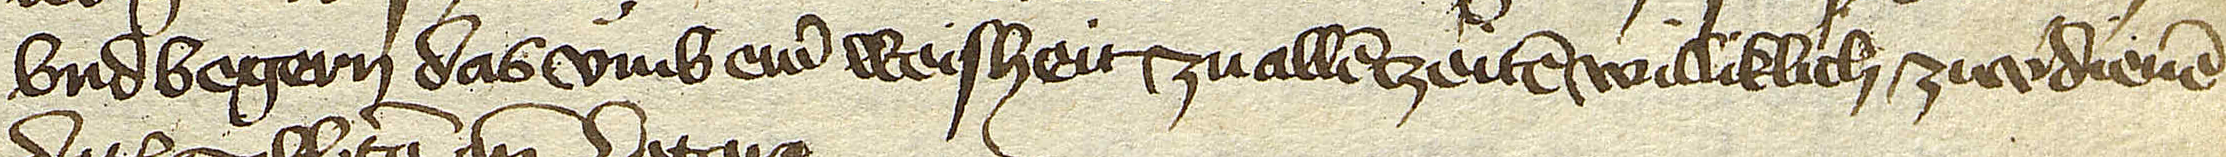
vnd begern das v̈mb ew* weiſheit cʒu alle*cʒeite* williklich / cʒuv*diene*
